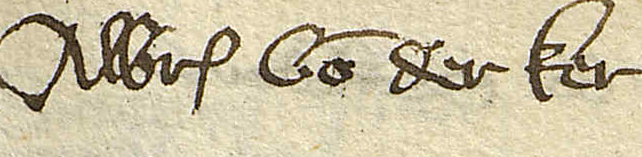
Albr* vo* der Ker
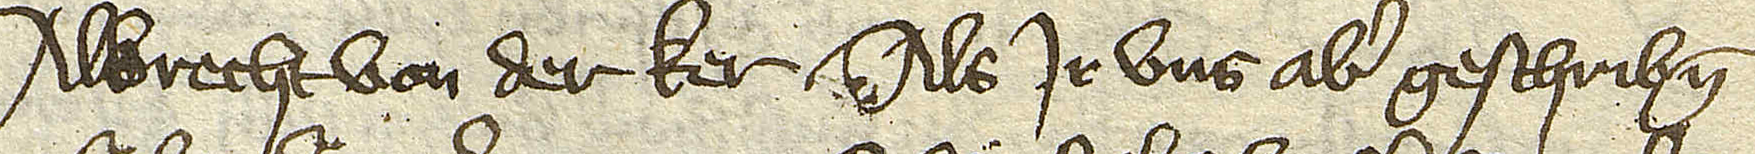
Albrecht von der Ker / Als Ir vns ab* geſchribn*
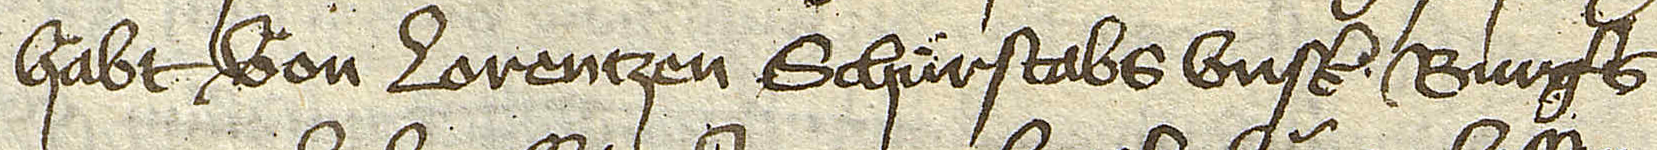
habt / von Lorencʒen Schürſtabs vnſs* Burg*s
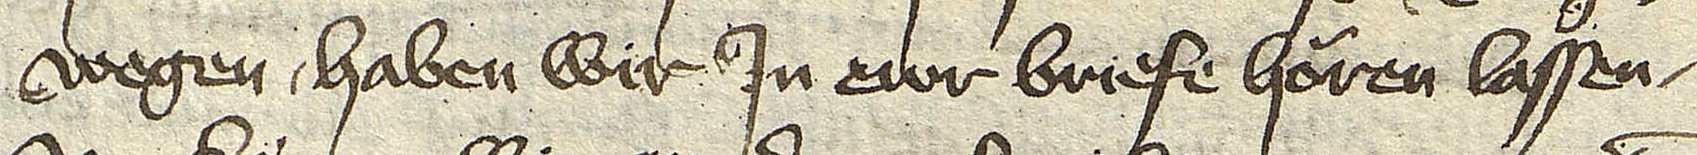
wegen / haben wir In ewr briefe hören laſſen /
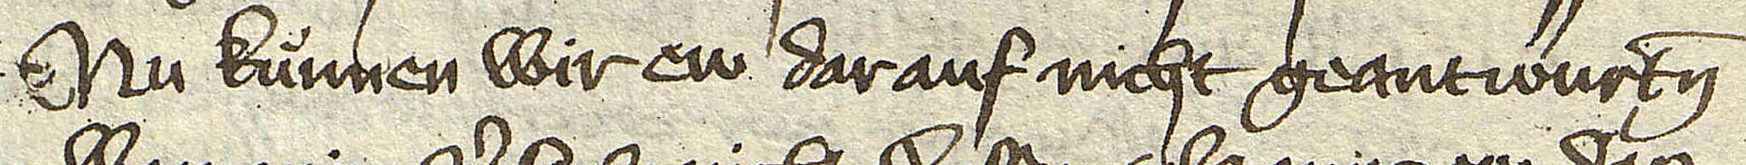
Nu künnen wir ew darauf nicht geantwurtn*
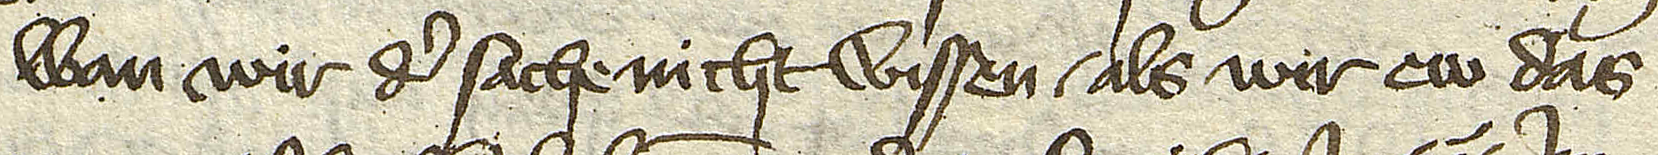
wan wir d* ſache nicht wiſſen / als wir ew das
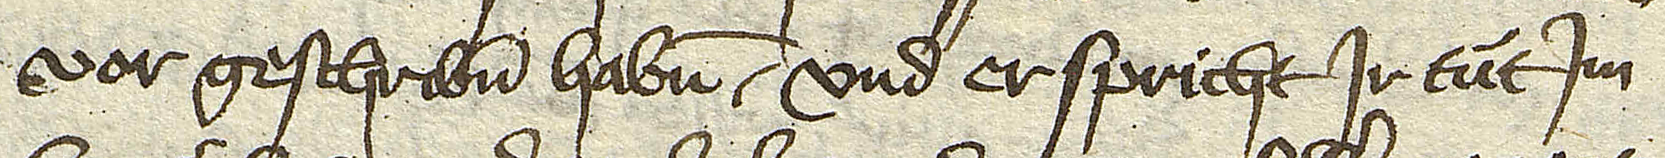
vor geſchribn* habn* / vnd er ſpricht Ir tüt Im
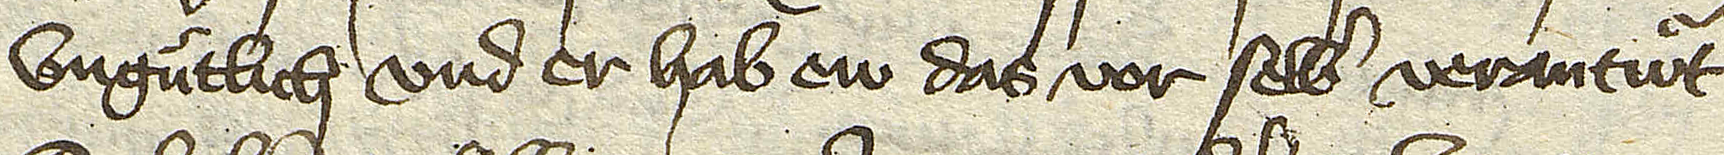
vngütlich vnd er hab ew das vor ſelb* verantwt*
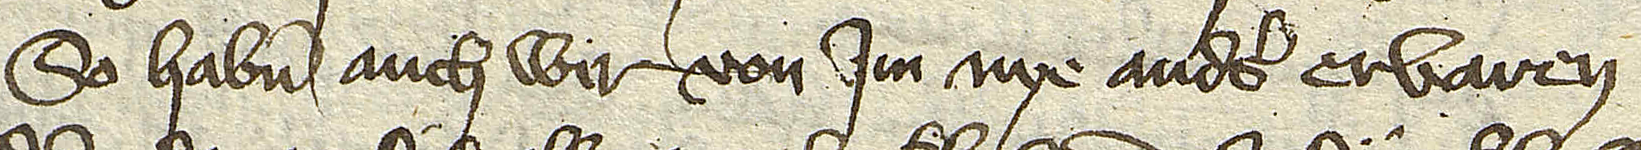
So habn* auch wir von Im nye ands* ervaren
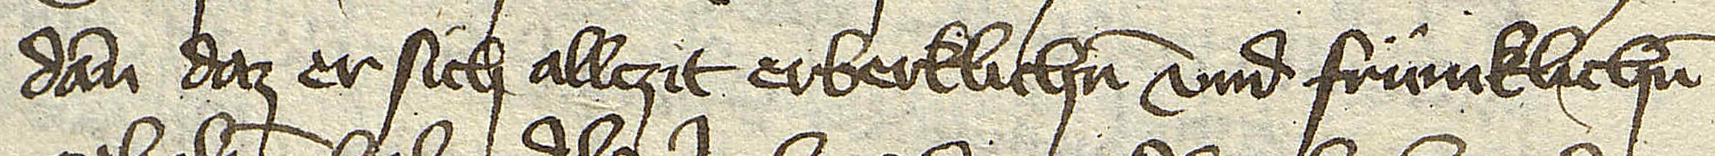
dan* daʒ er ſich allcʒeit erberklichn* vnd frümklichn*
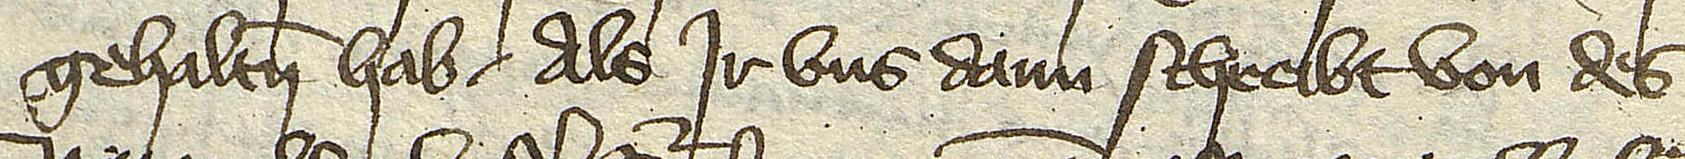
gehaltn* hab / Als Ir vns dann ſchreibt von des
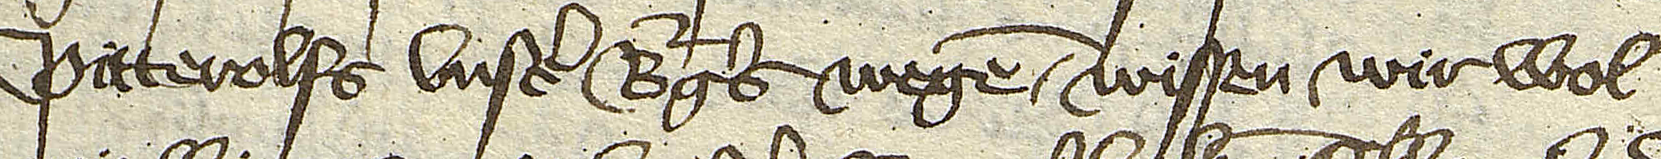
Pitterolfs vnſs* B*g*s wege* / wiſſen wir wol
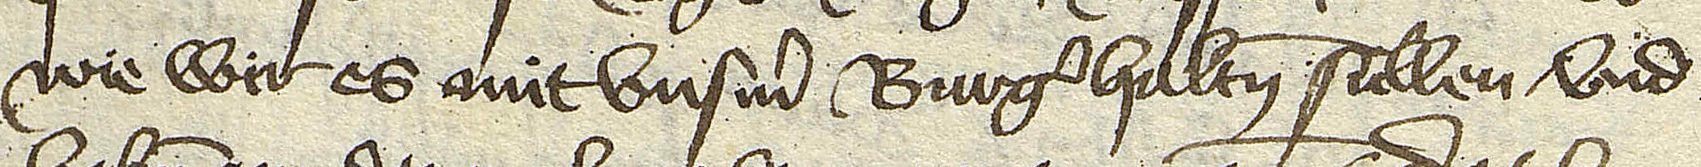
wie wir es mit vnſm* Burg* haltn* ſüllen / vnd
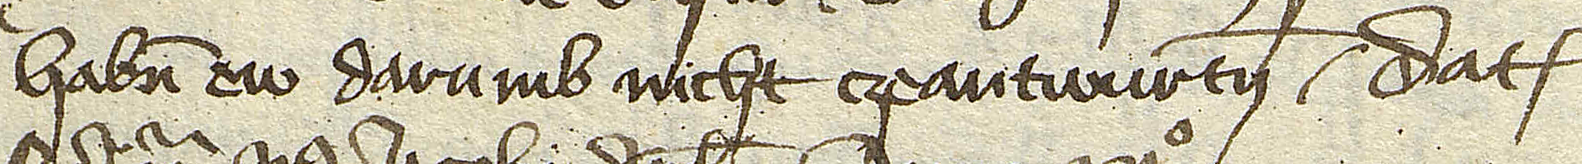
habn* ew darumb nichr cʒeantwurtn* / Dat*
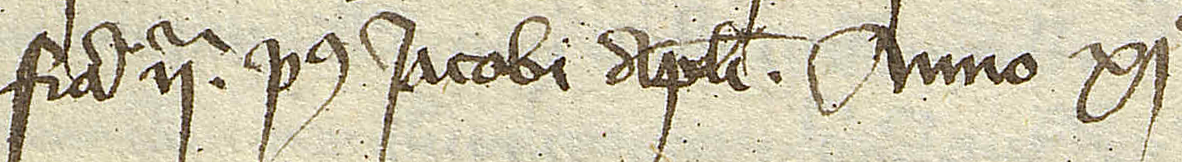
fia* ii*. p* Iacobi Apli* . Anno xi*
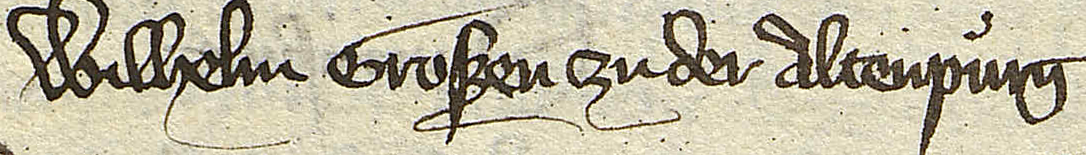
Wilhelm Groſʒen cʒu der Altenpürg
